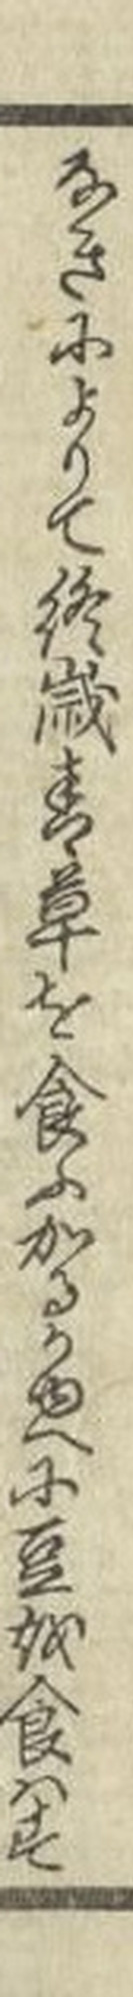なきによりて終歳春草を食ふかるかゆへに豆を食はす
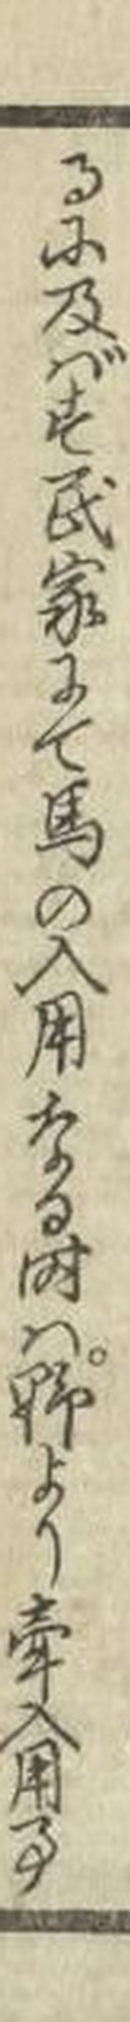るに及ばす民家にて馬の入用なる時は。野より牽入用事
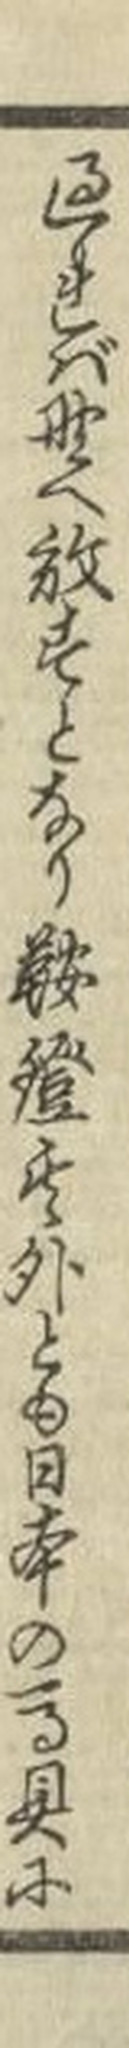過れば野へ放すとなり鞍鐙其外とも日本の馬具に
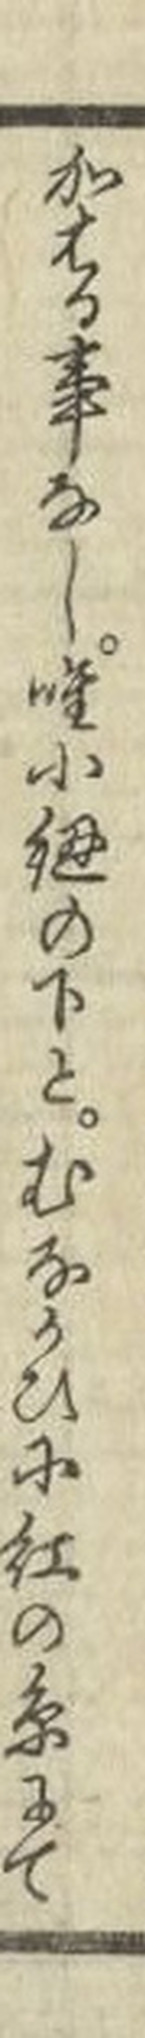かはる事なし。唯小紐の下と。むなかひに紅の糸にて
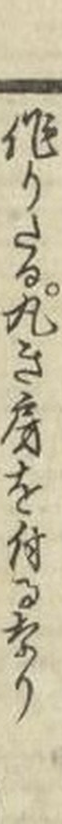作りたる。丸き房を付るなり
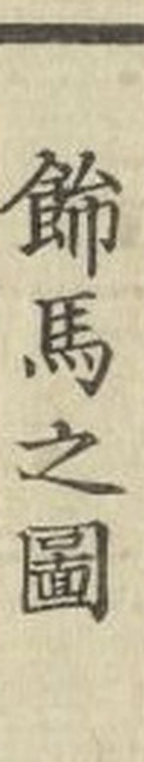飾馬之図
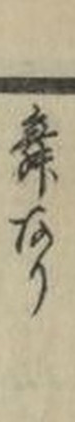舞あり
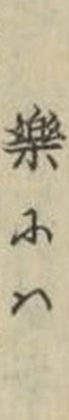楽には
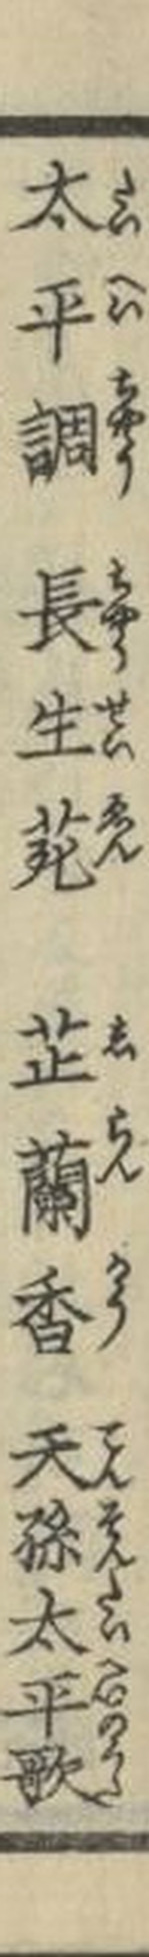太平調長生苑芷蘭香天孫太平歌
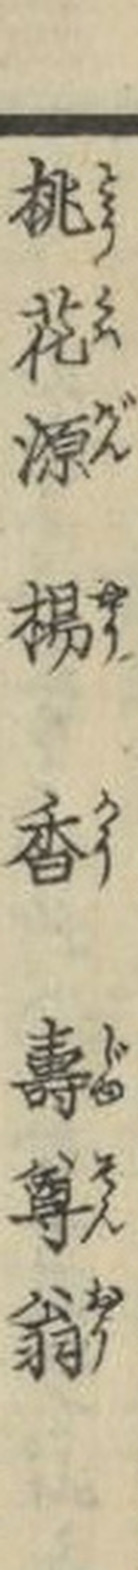桃花源楊香寿尊翁
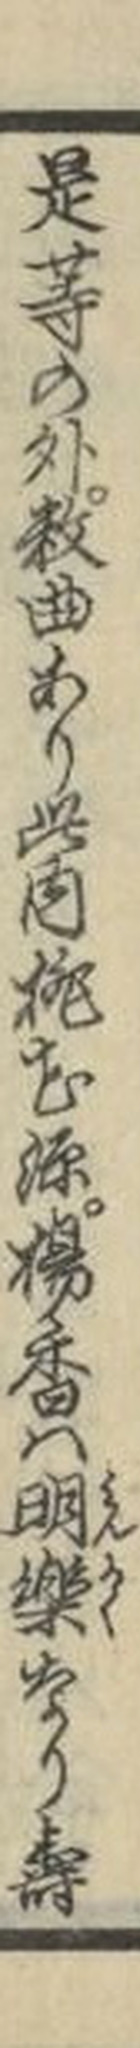是等の外。数曲あり此内桃花源。楊香は明楽なり寿
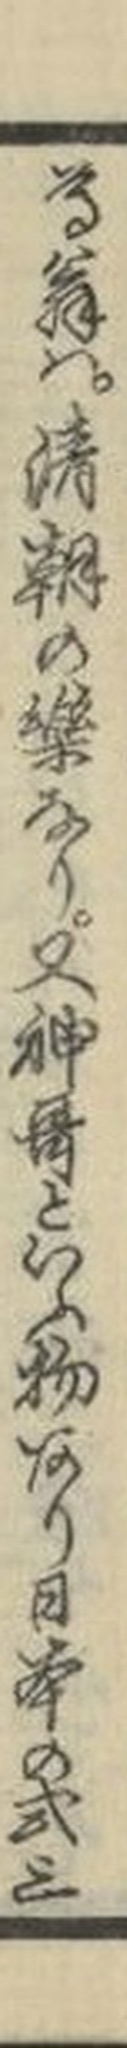尊翁は。清朝の楽なり。又神哥といふ物あり日本の式三
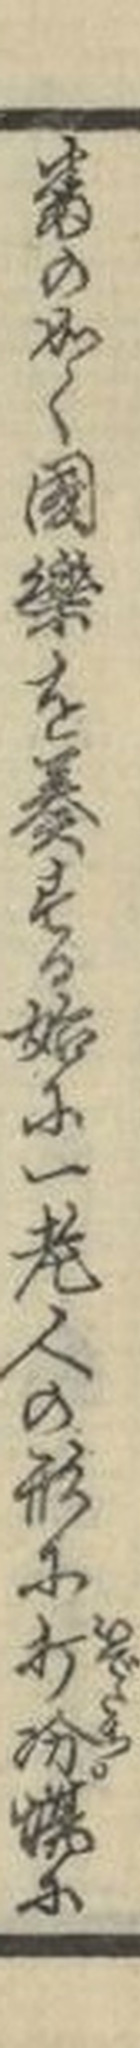番の如く国楽を奏する始に一老人の形に打扮。場に
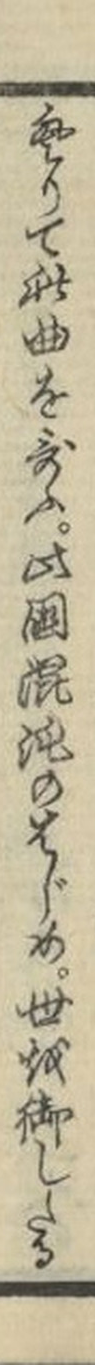登りて此曲を哥ふ。此国混沌のはじめ。世を御したる
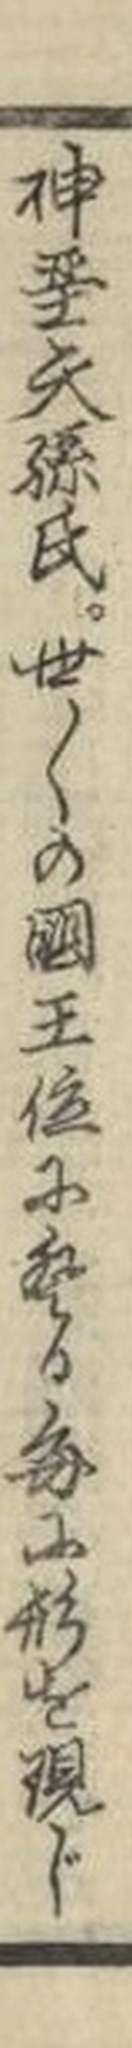神垩天孫氏。世〳〵の国王位に登る毎に形を現じ
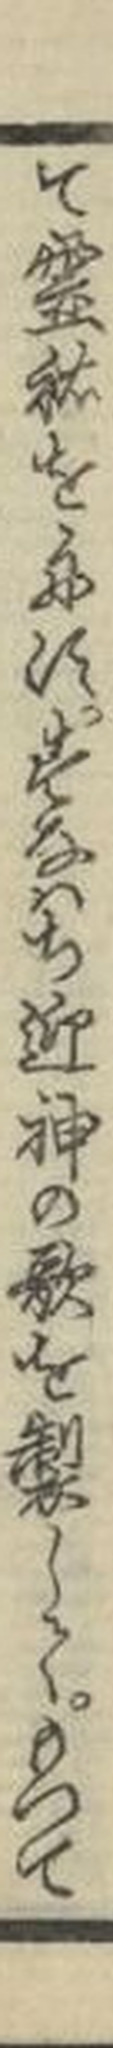て霊祐を示す。すなはち迎神の歌を製して。もつて
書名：琉球解語
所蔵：University of the Ryukyus Library
